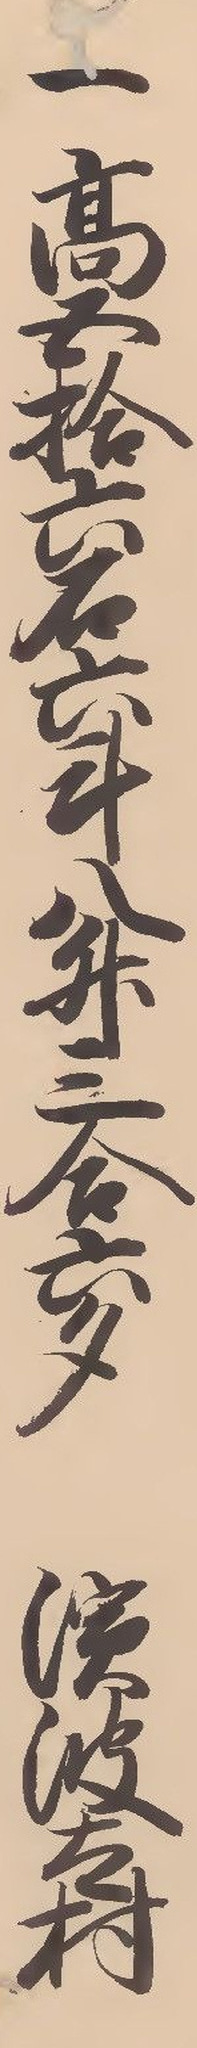一高五拾六石六斗八升三合六勺浜波太村
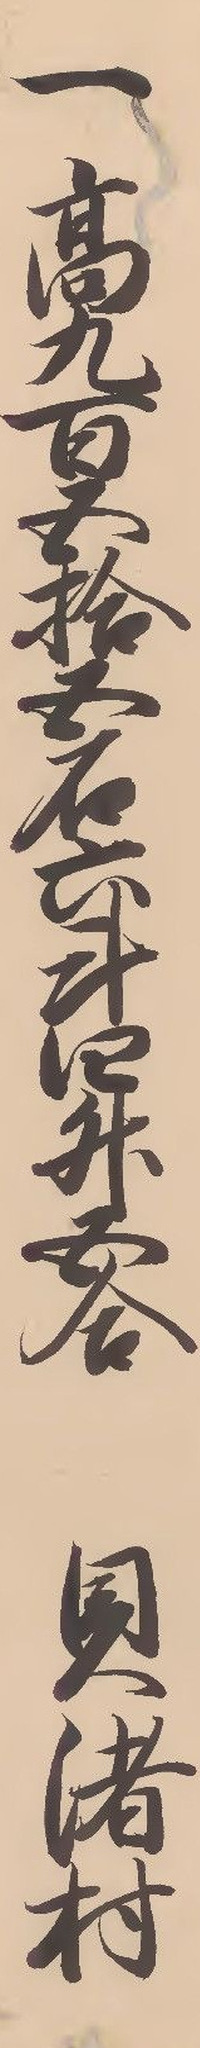一高九百五拾五石六斗四升五合貝渚村

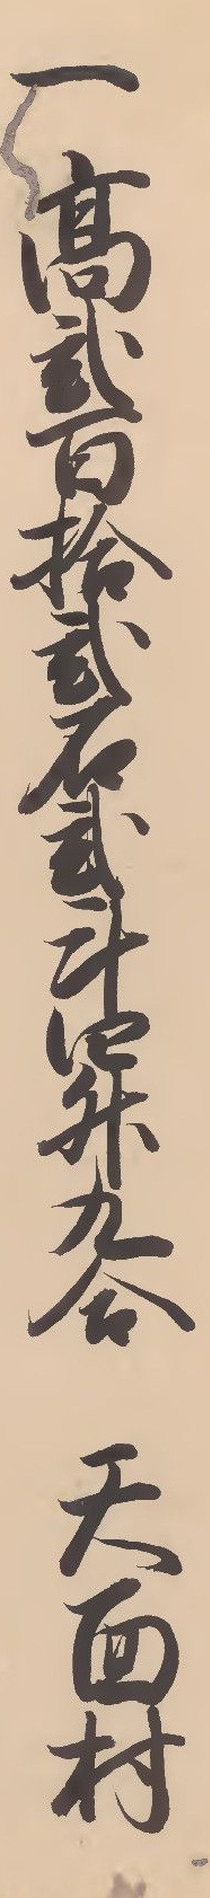一高弐百拾弐石弐斗四升九合天面村
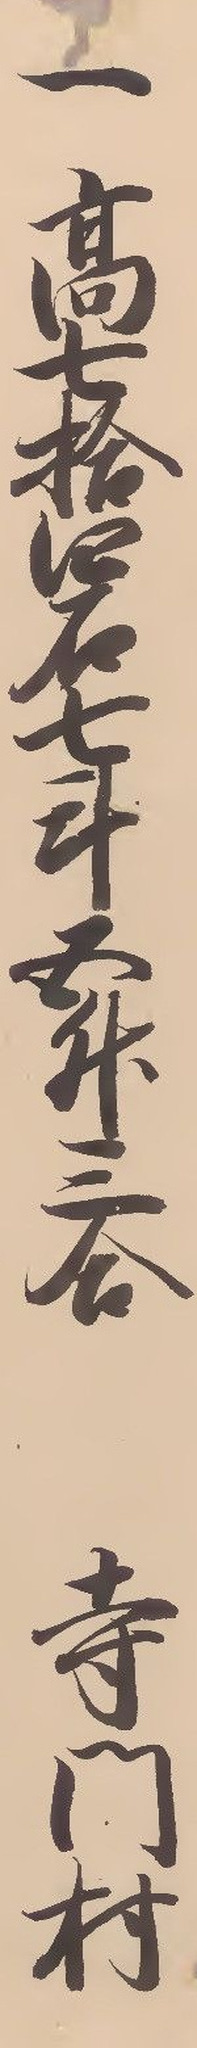一高七拾四石七斗五升三合寺門村
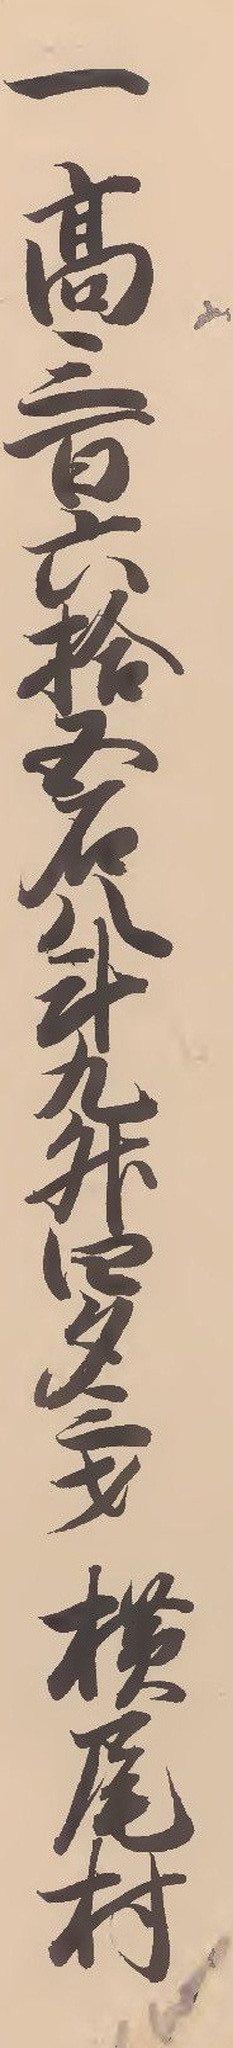一高三百六拾五石八斗九升四勺三才横尾村
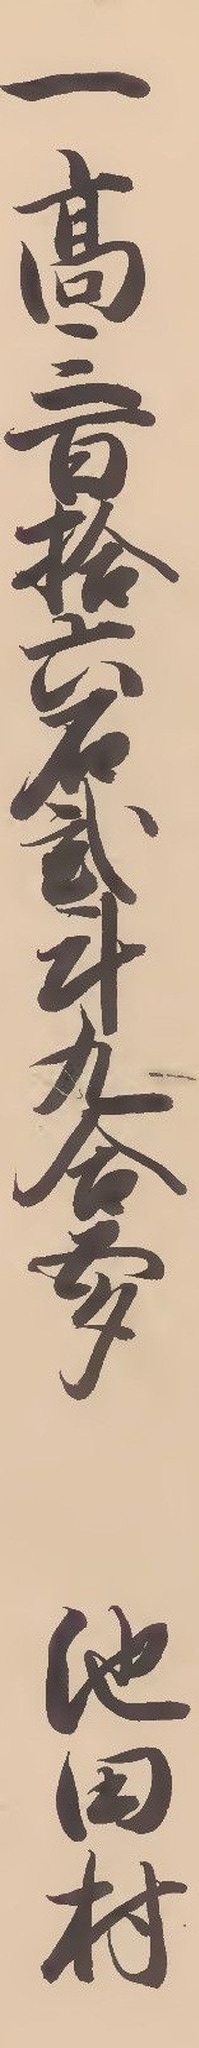一高三百拾六石弐斗九合五勺池田村
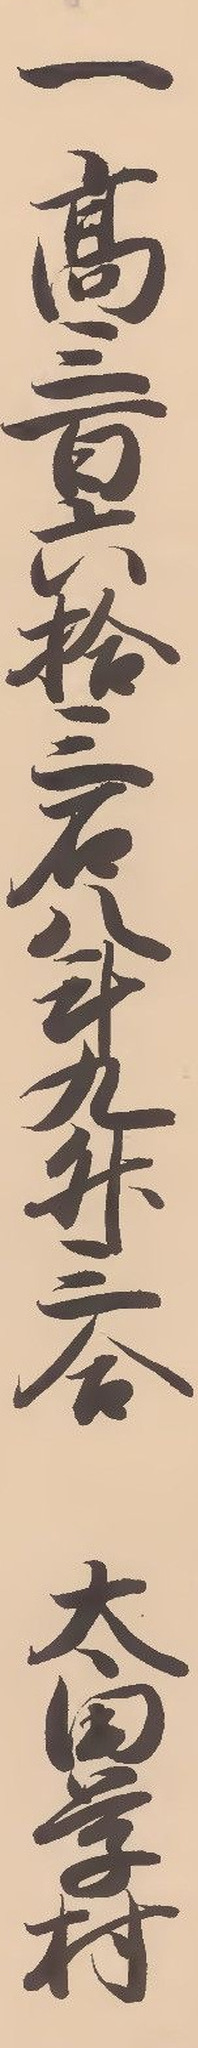一高三百六拾三石八斗九升三合太田学村
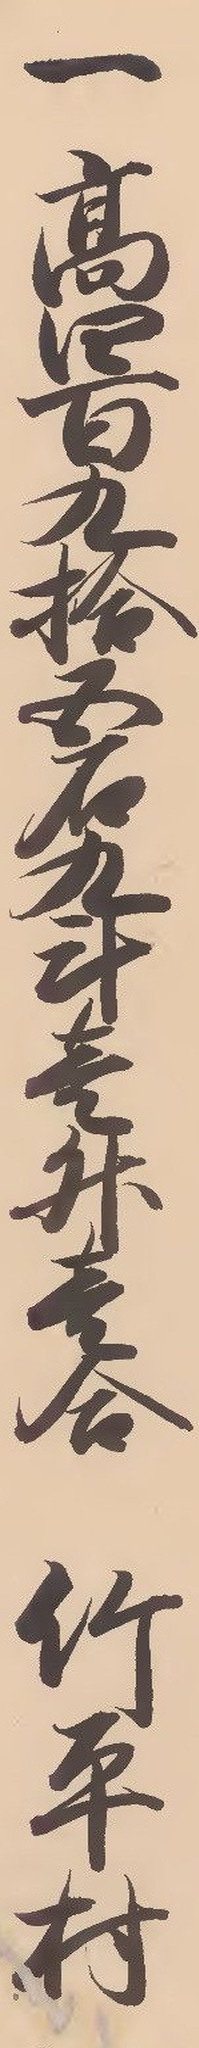一高四百九拾五石九斗壱升壱合竹平村
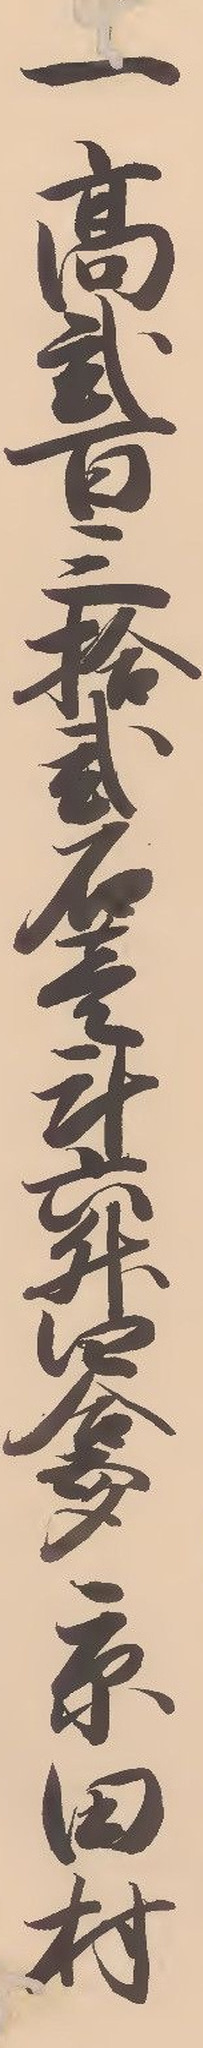一高弐百三拾弐石壱斗六升四合五勺京田村
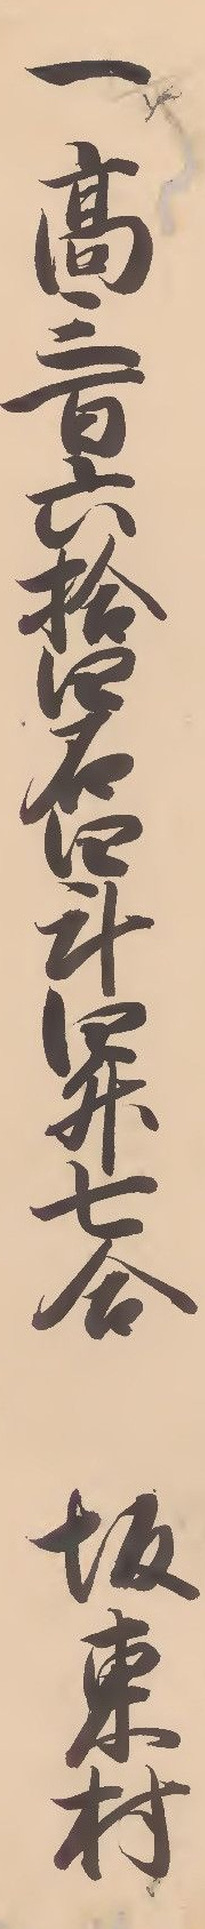一高三百六拾四石四斗四升七合坂東村

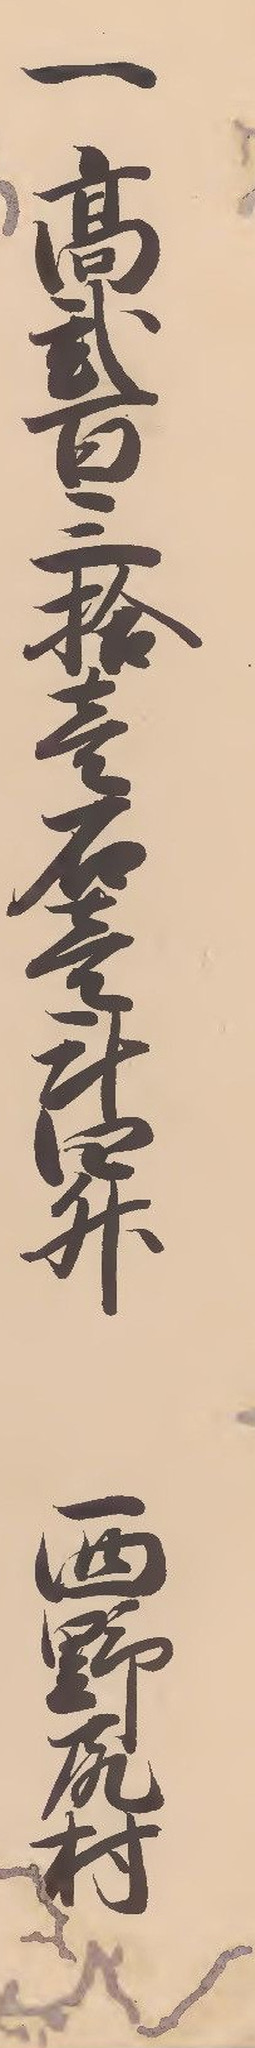一高弐百三拾壱石壱斗四升西野尻村
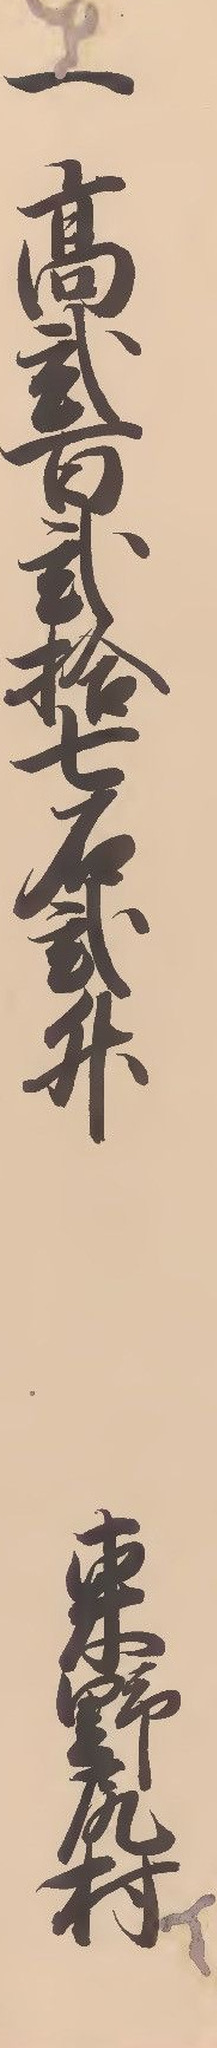一高弐百弐拾七石弐升東野尻村
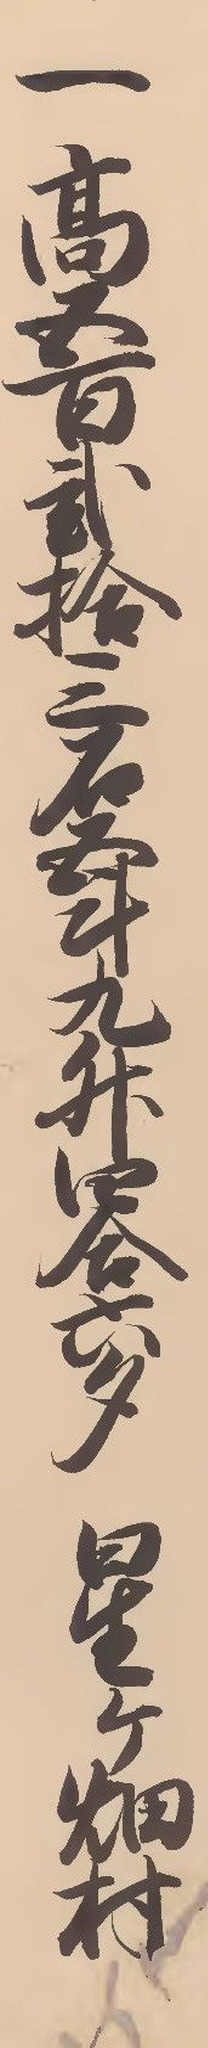一高五百弐拾三石五斗九升四合六勺星ヶ畑村
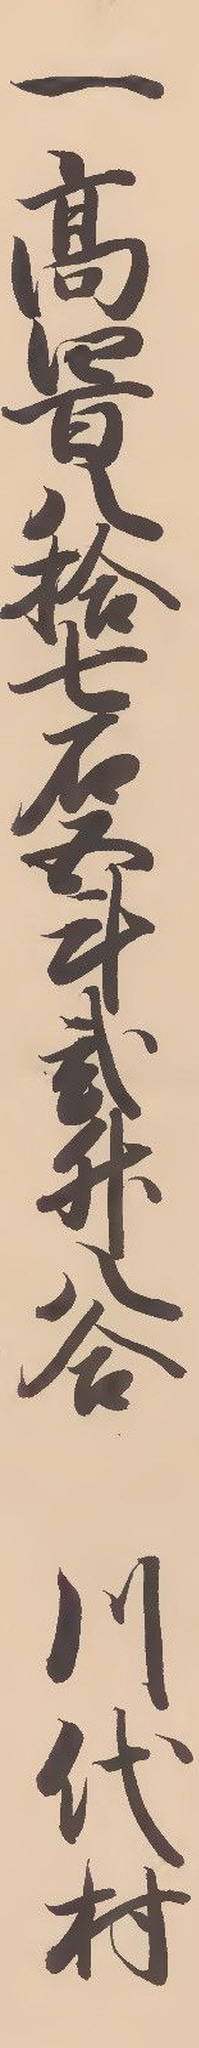一高四百八拾七石五斗弐升八合川代村
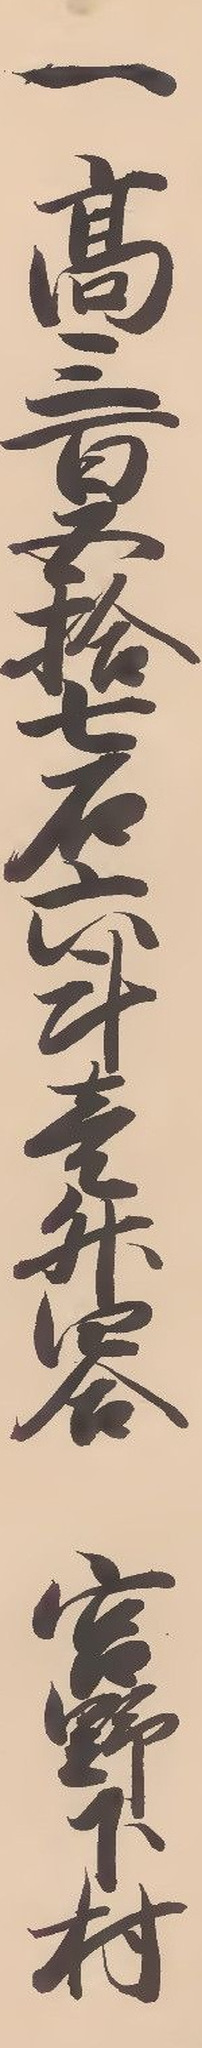一高三百五拾七石六斗壱升四合宮野下村
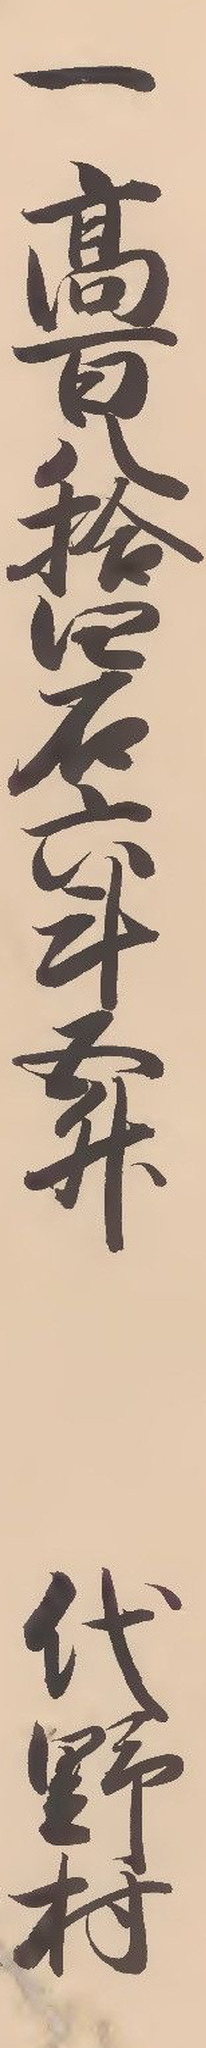一高百八拾四石六斗五升代野村
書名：安房国郷帳
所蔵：国立公文書館 National Archives of Japan
